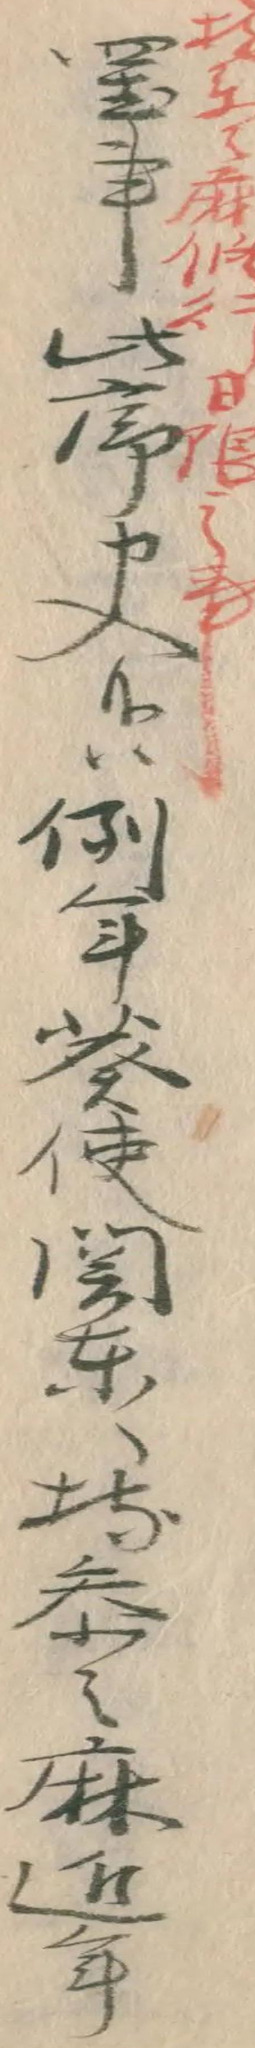置事此序申入候ハ例年葵使関東へ持参之麻近年

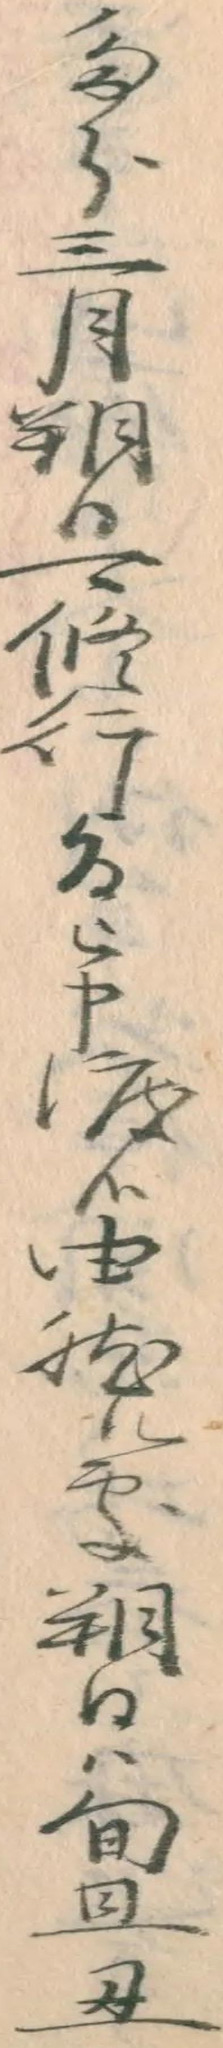多分三月朔日可修行旨被申渡候由然ル處朔日ハ旬且丑
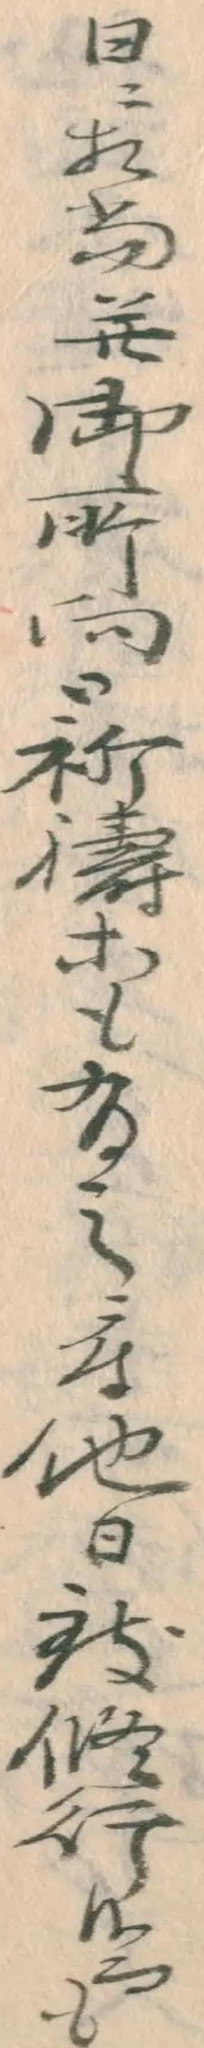日ニ相當并御所向御祈祷等も有之ニ付他日被修行候而も
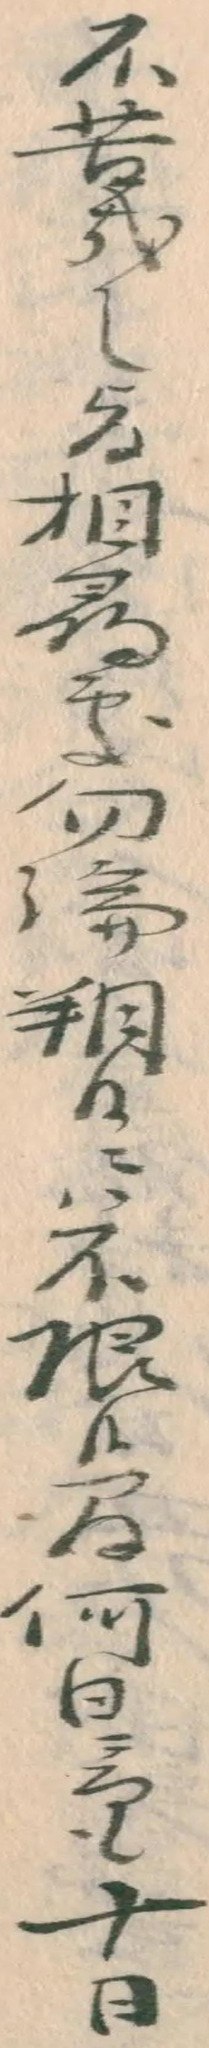不苦哉之旨相尋處勿論朔日ニハ不限候間何日ニ而も十日
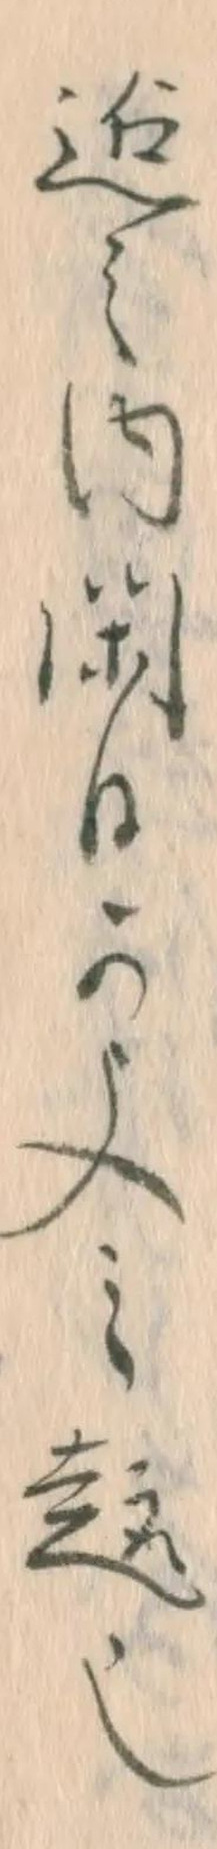迄之内閑日可申入之趣也
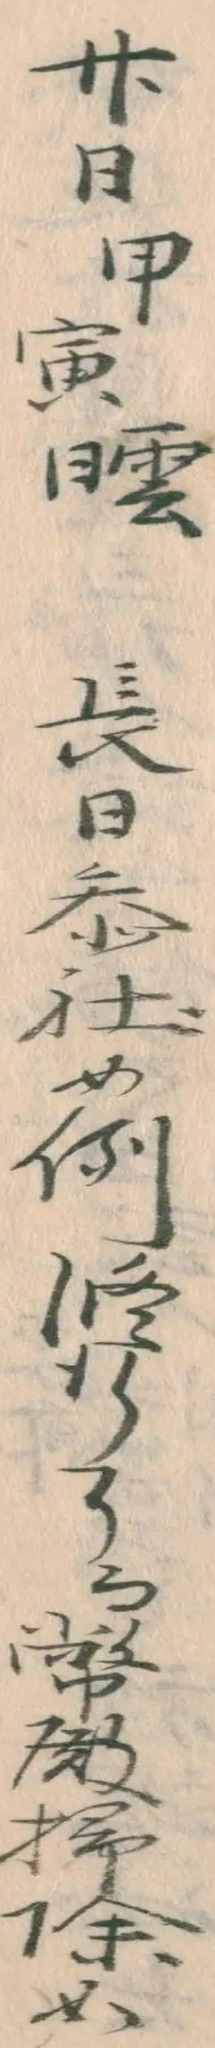廿日甲寅曇長日参社如例修行了而幣殿掃除如例也
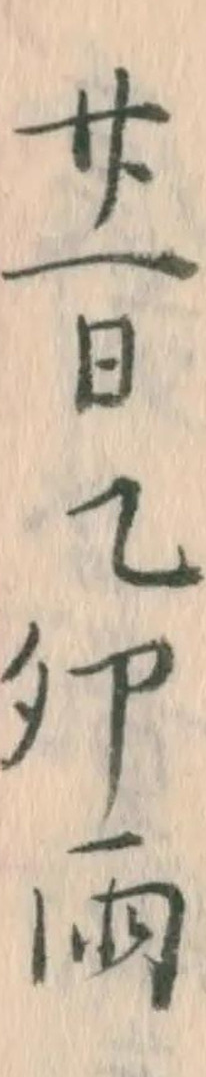廿一日乙卯雨
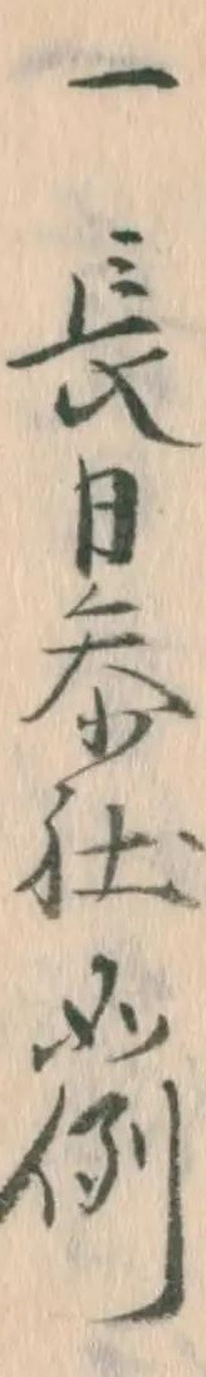一長日参社如例
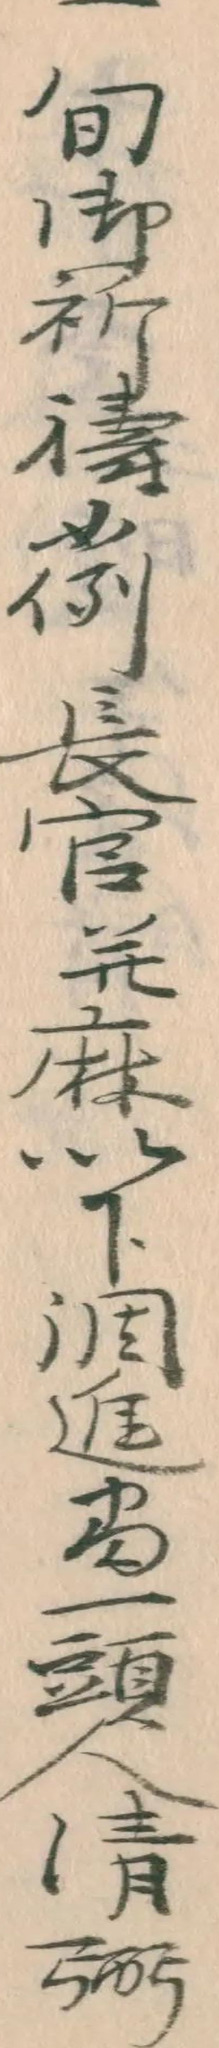一旬御祈祷如例長官并麻以下調進番一頭人清弼
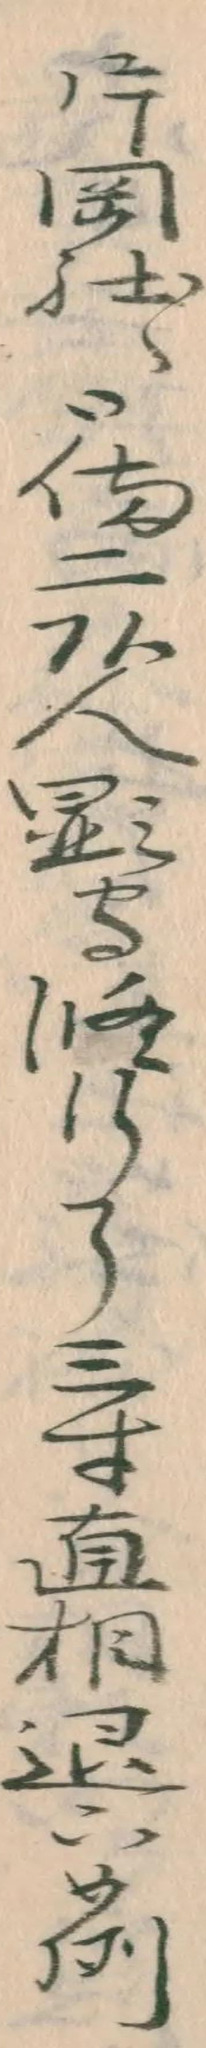片岡社へ御備二頭人顕守修行了三寸直相退出如例
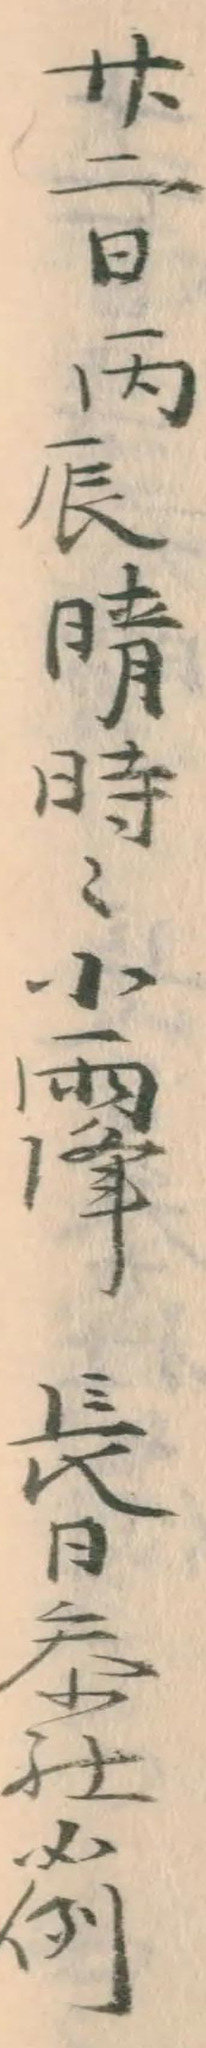廿二日丙辰晴時々小雨降長日参社如例
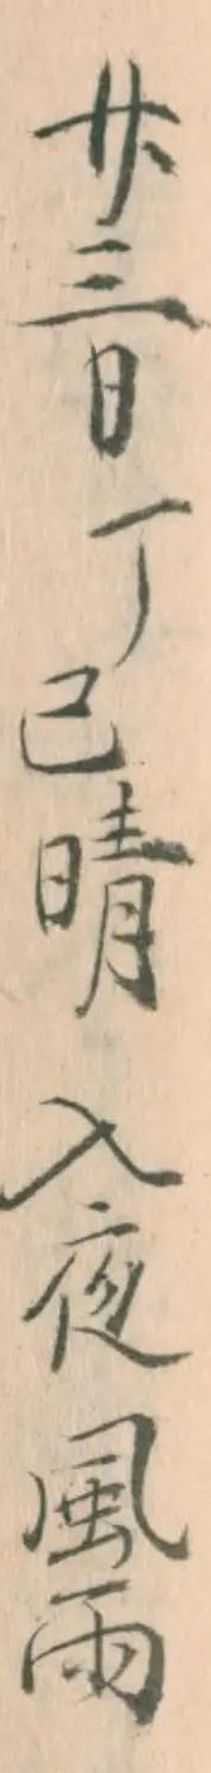廿三日丁巳晴入夜風雨
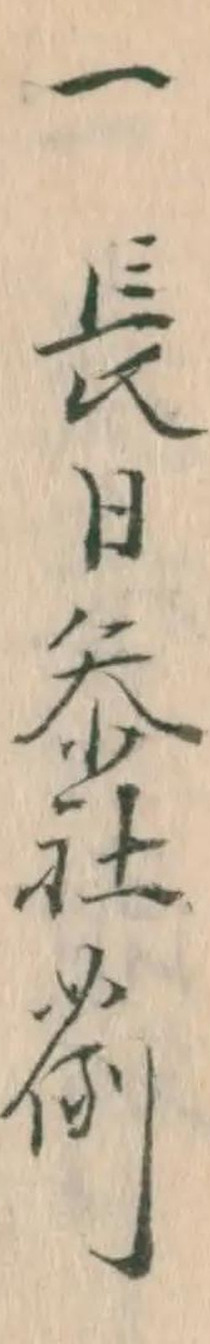一長日参社如例
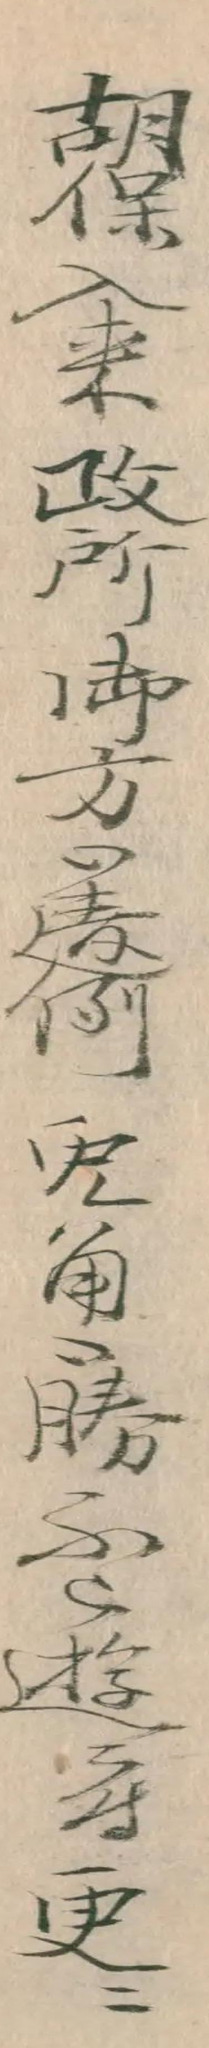一胡保入来政所御方御違例兎角御勝不被遊ニ付更ニ
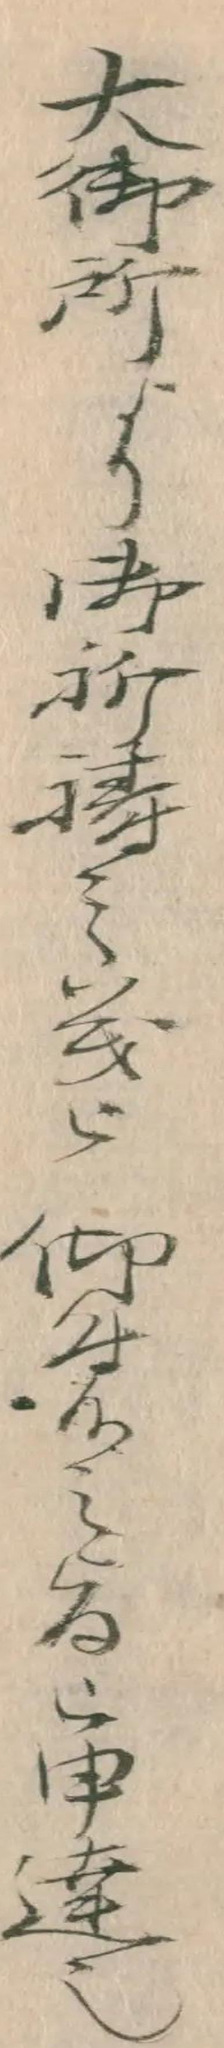大御所より御祈祷之義被仰付候之旨被申達也
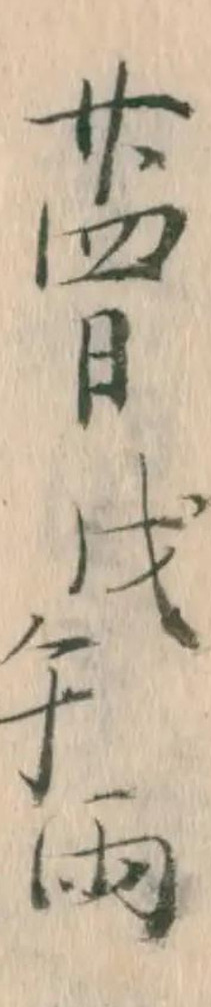廿四日戊子雨
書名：賀茂社記録. 第72冊
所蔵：国立国会図書館 National Diet Library, JAPAN
